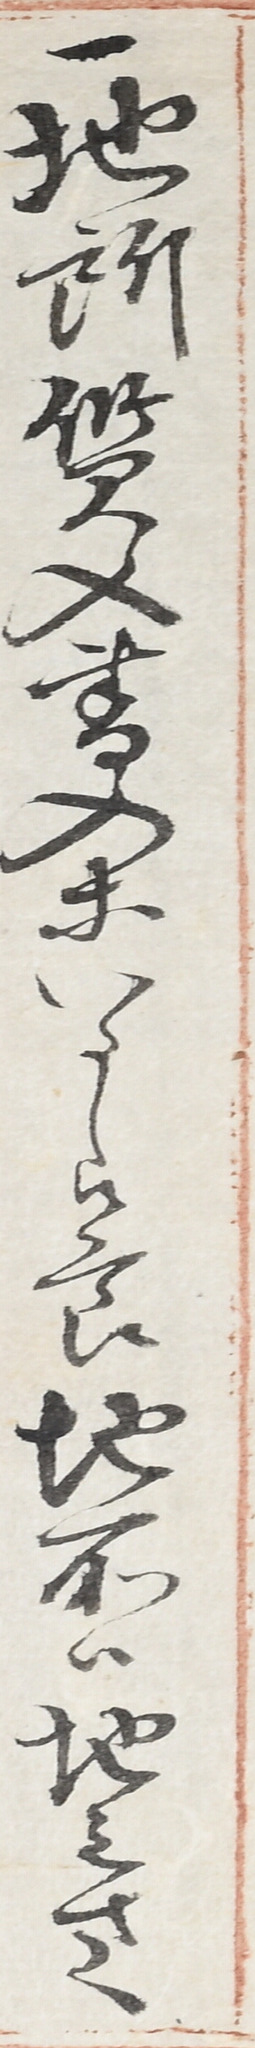一地所質入書入等いたし候節地所は地主方へ
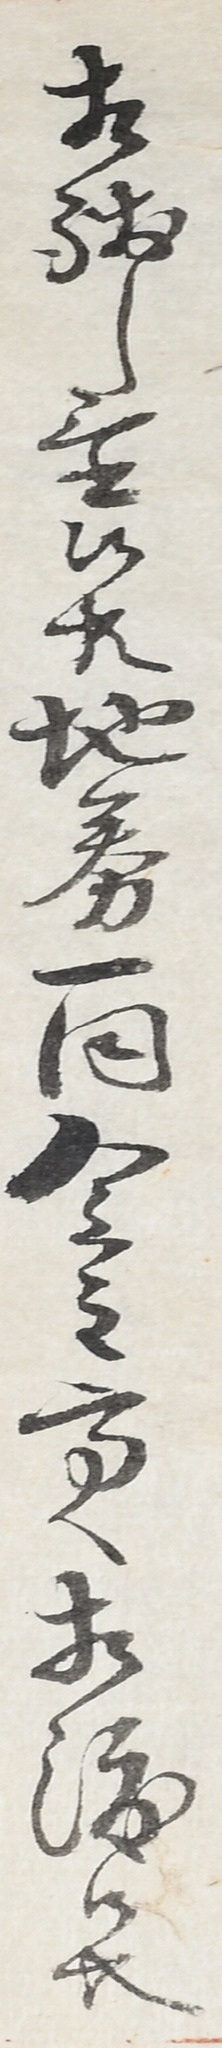相残し置候共地券一同金主方へ相渡候共

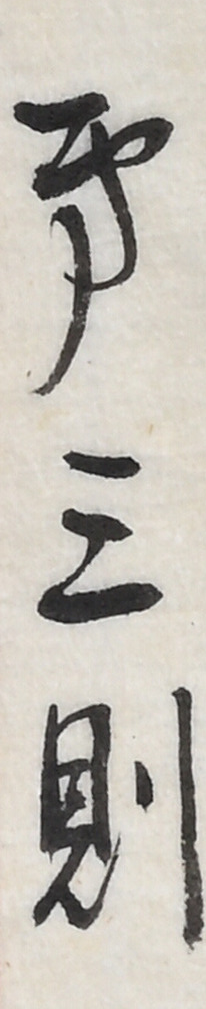第三則
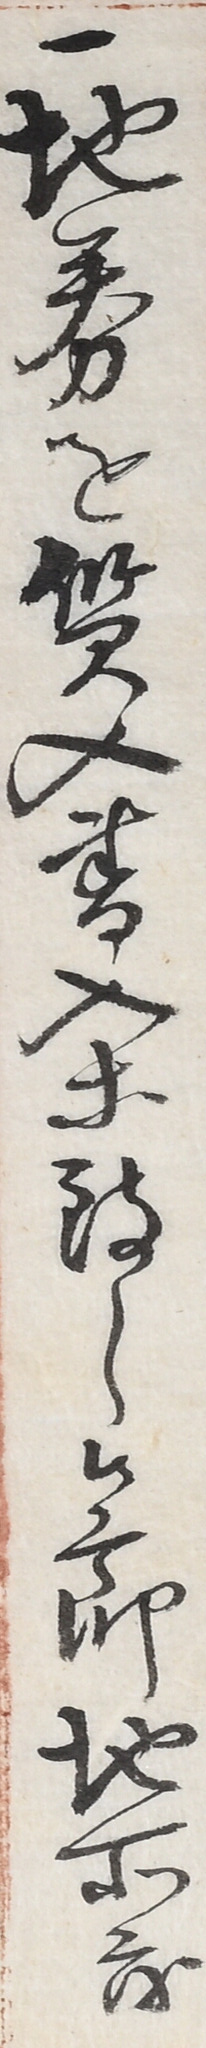一地券を質入書入等致し候節地所も
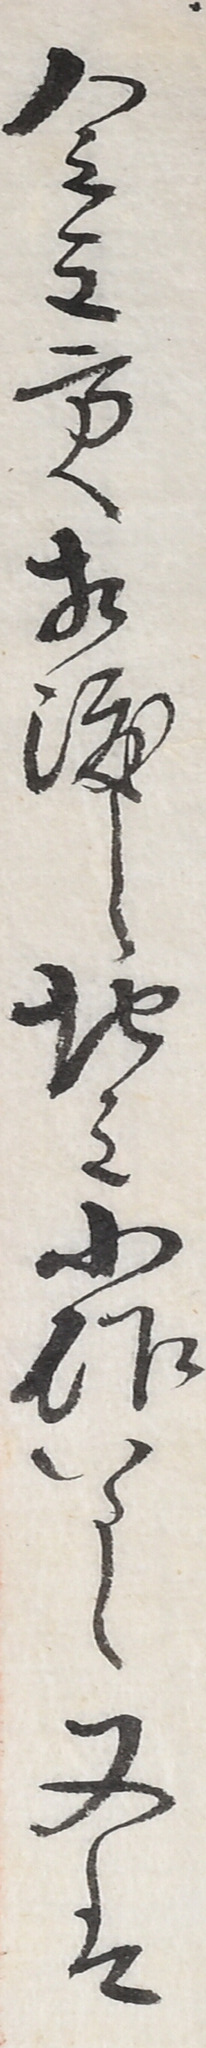金主方へ相渡し地主小作いたし又は
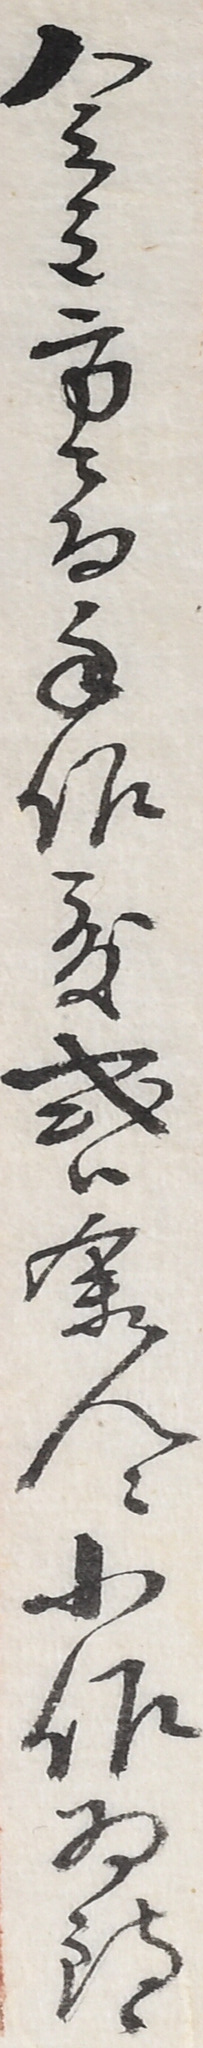金主方にて手作致或は余人に小作為致候
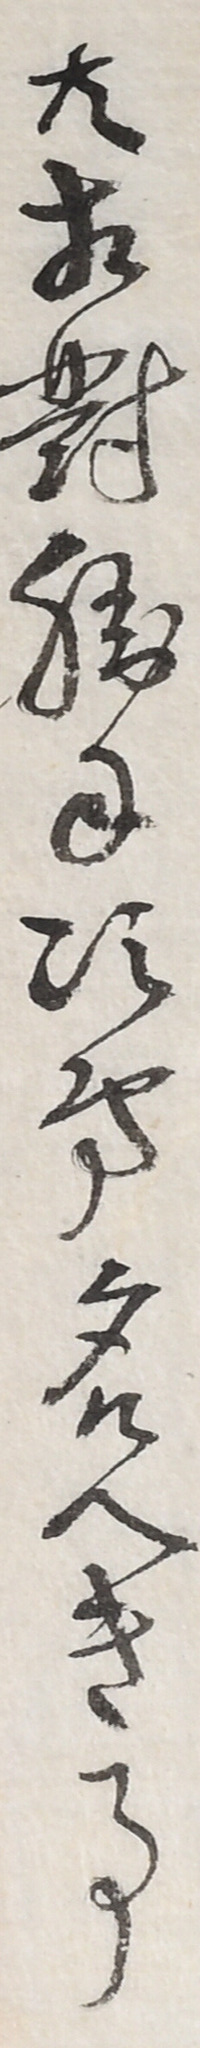共相対勝手次第たるへき事
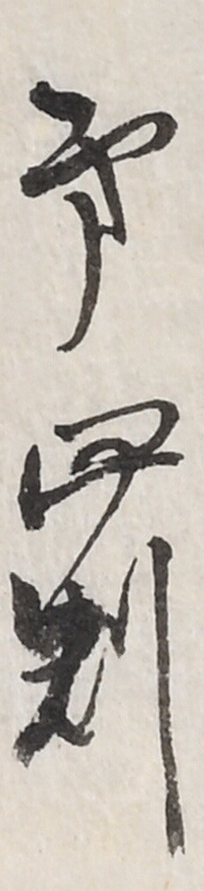第四則
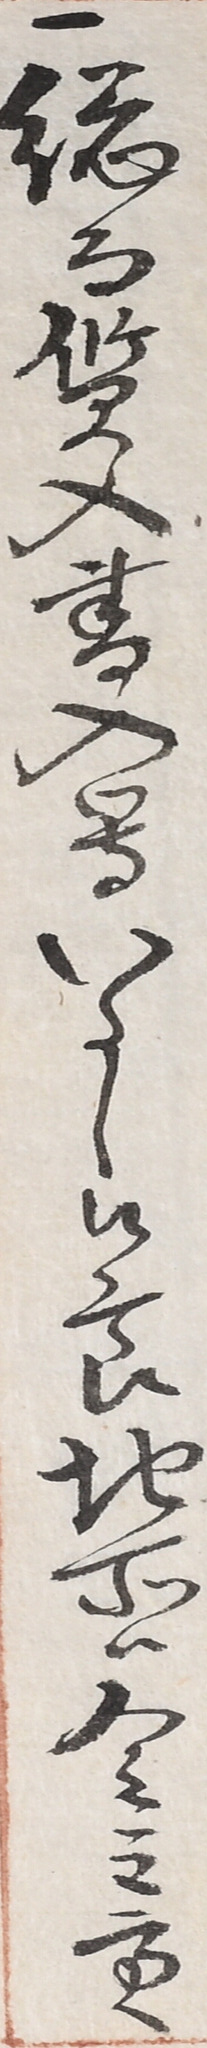一総而質入書入等いたし候節地所は金主方へ
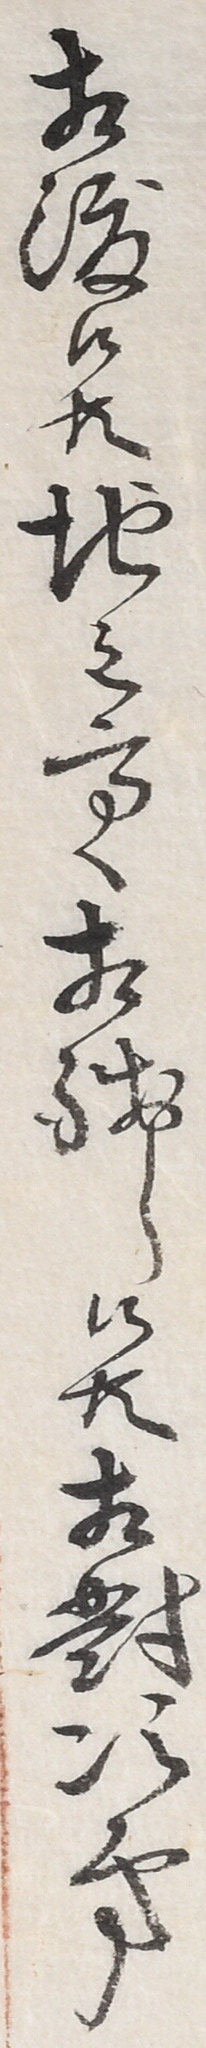相渡候共地主方へ相残し候共相対次第
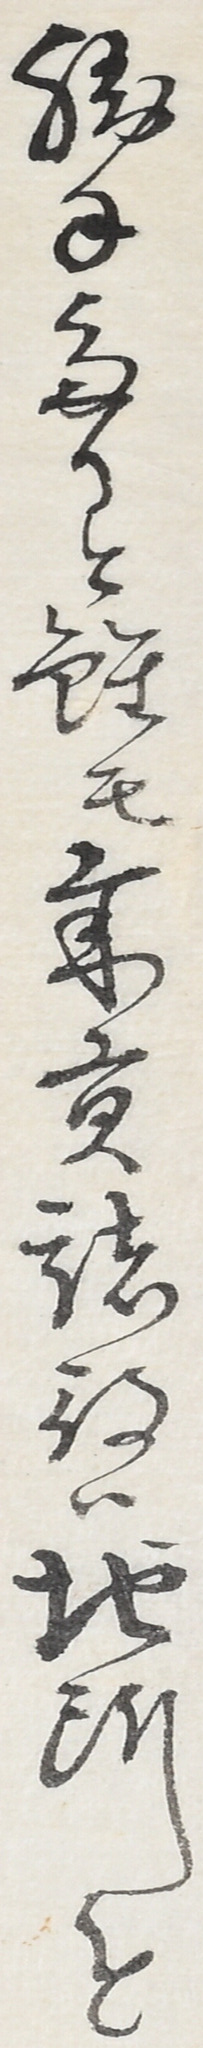勝手たりと雖も年貢諸役は地所を
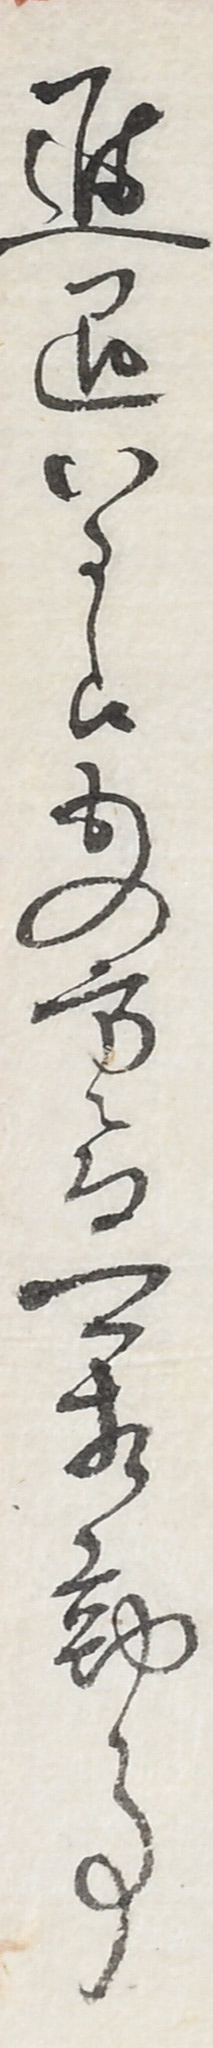進退いたし候もの方にて可相勤事
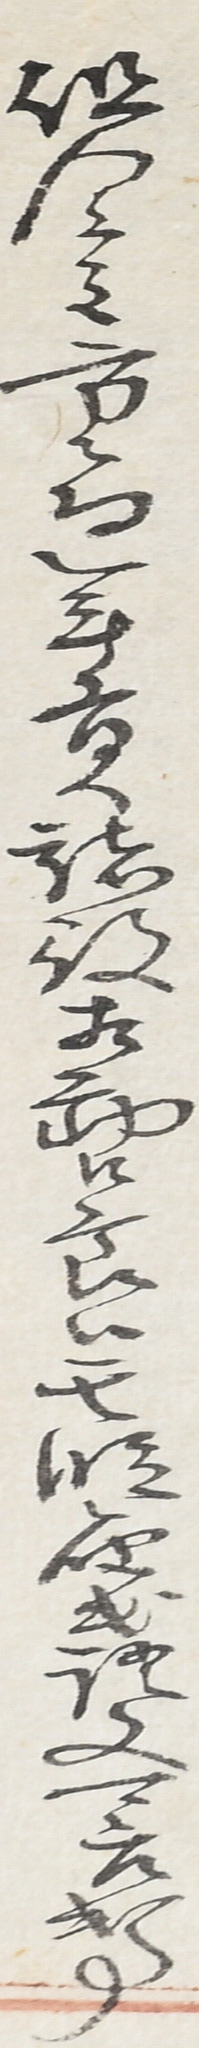但金主方にて年貢諸役相勤候節は其段届出証文可差出事
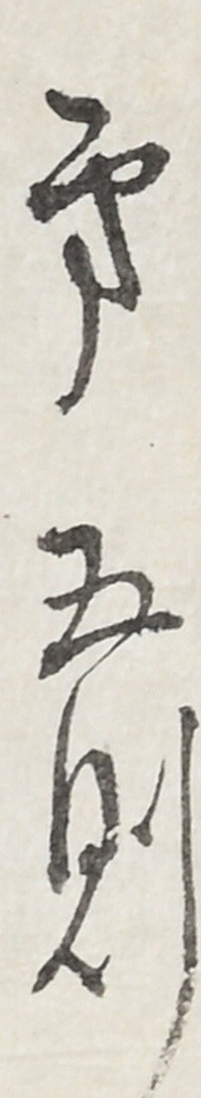第五則
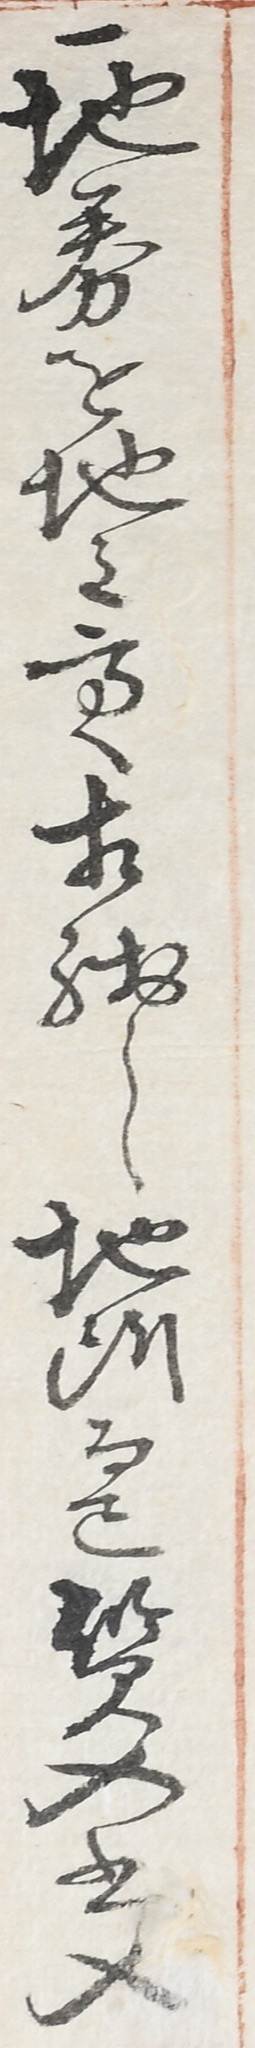一地券を地主方へ相残し地所而已質入書入
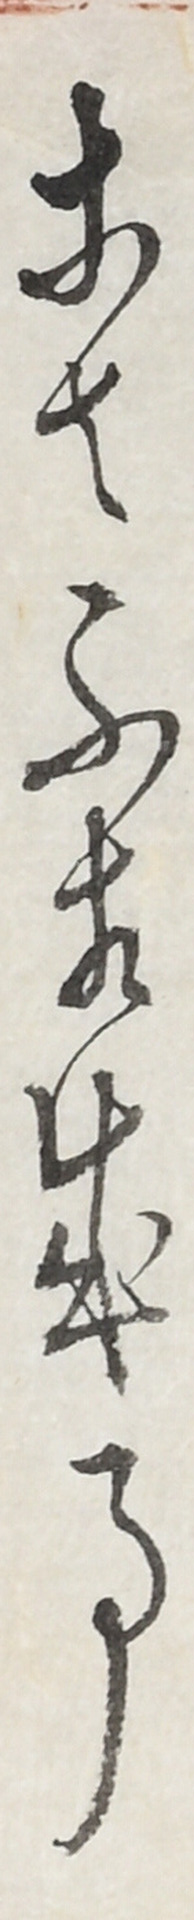等は不相成事
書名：壹番・御布告一式
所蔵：伊那市立高遠町図書館・合同会社AMANE
